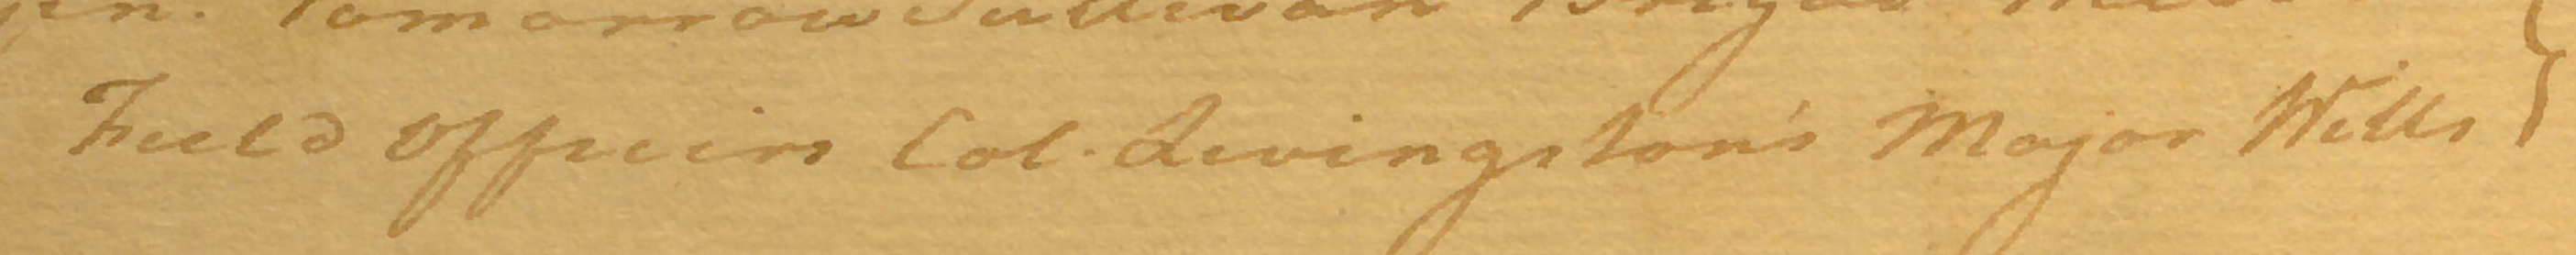Field Officers Col. Livingston's Major Wills
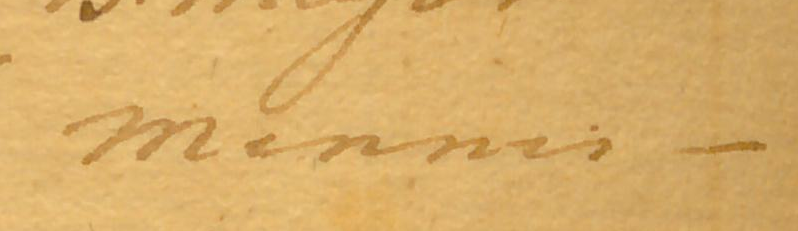Minnis-
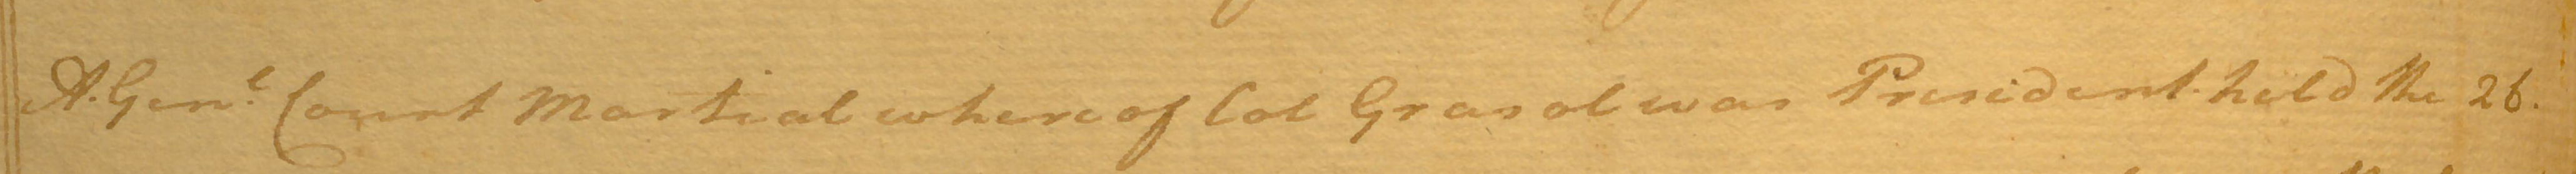A Gen^l. Court Martial whereof Col Grasol was President held the 26.
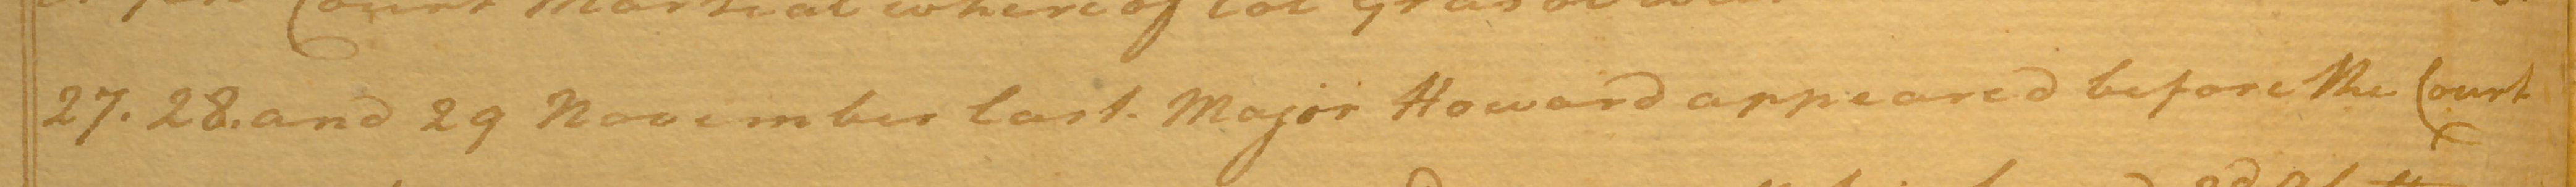27. 28. and 29 November last Major Howard appeared before the Court
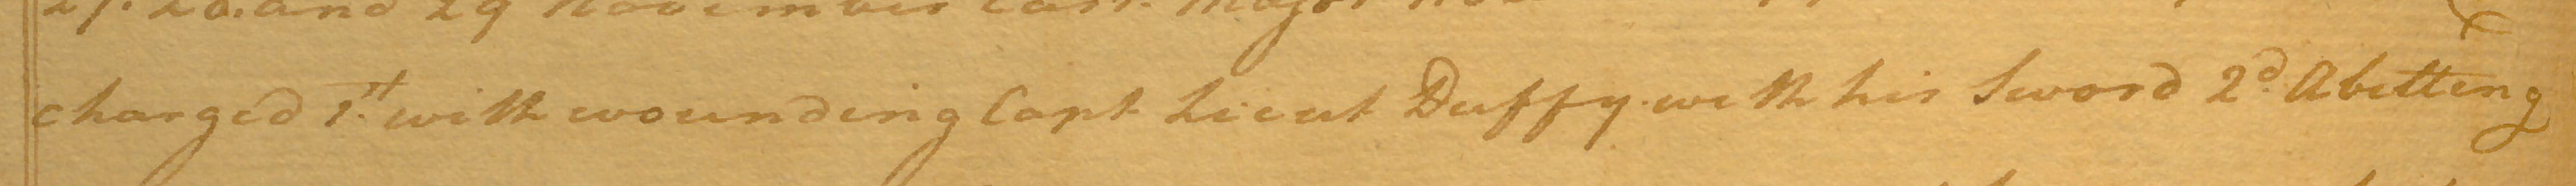charged 1^st. with wounding Capt Lieut Duffy with his Sword 2^d. Abetting
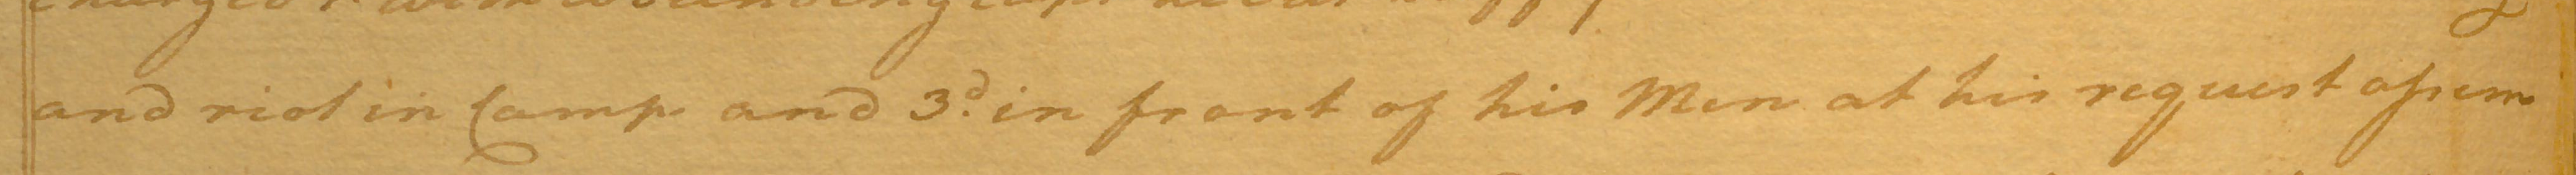and riot in Camp and 3^d. in front of his Men at his request assem
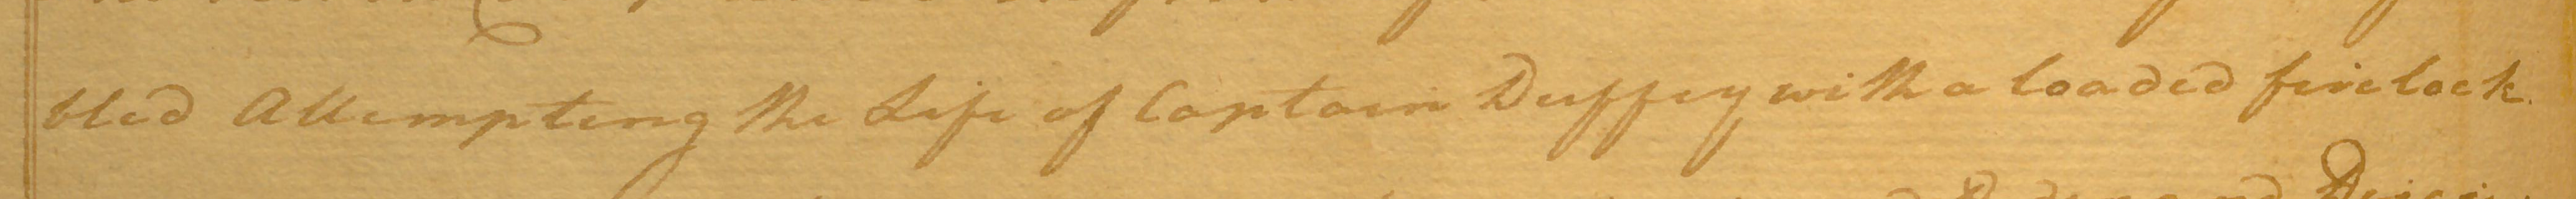bled Attempting the Life of Captain Duffey with a loaded firelock
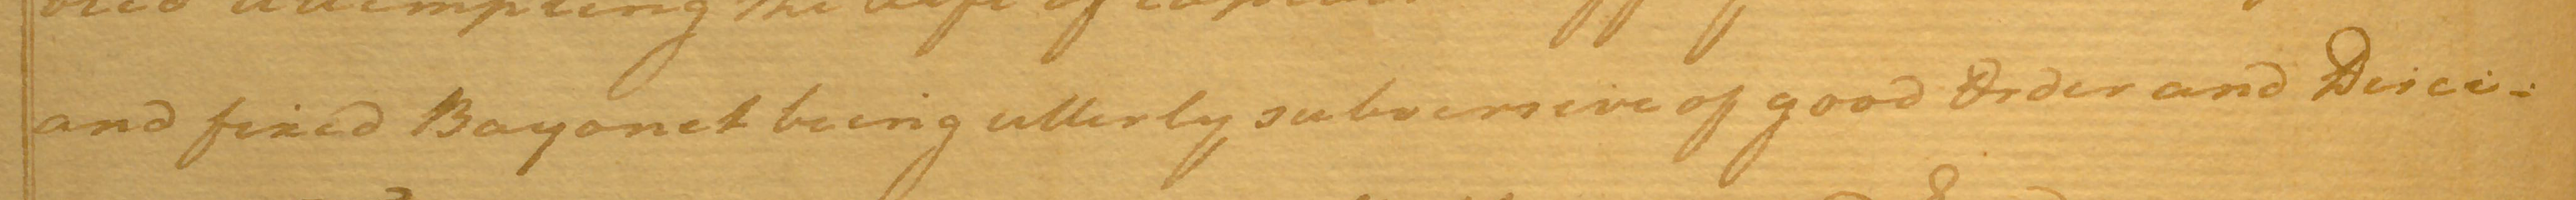and fired Bayonet being utterly subversive of good Order and Disci-
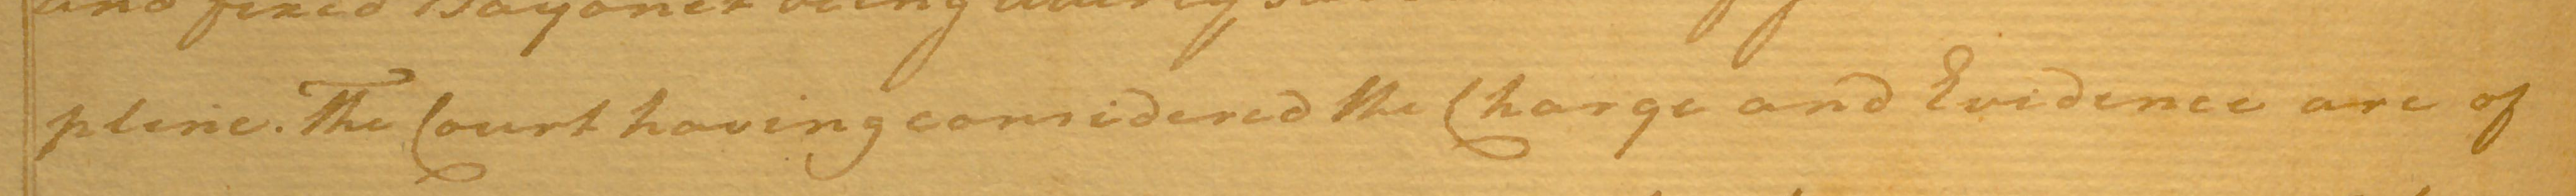pline. The Court having considered the Charge and Evidence are of
